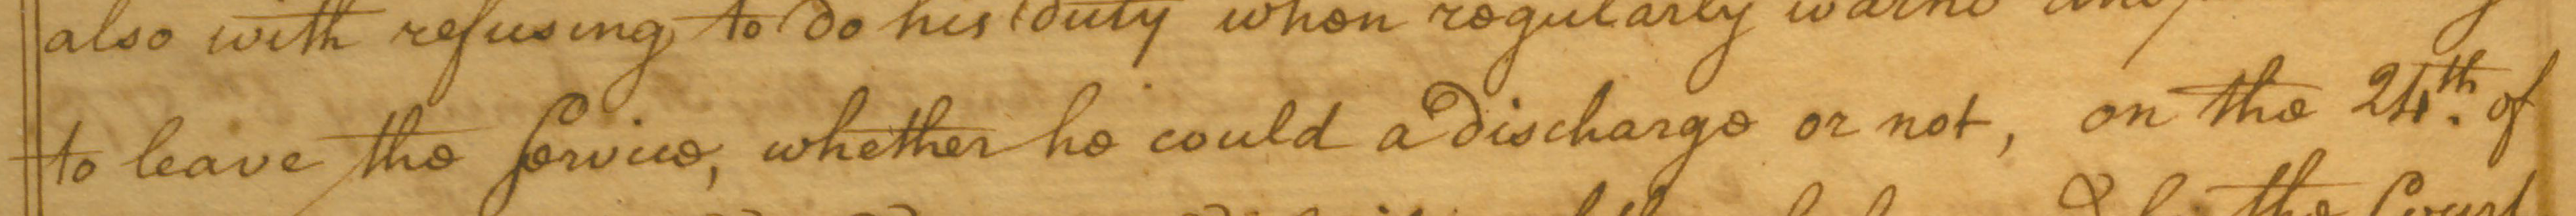to leave the Service, whether he could discharge or not, on the 24^th. of
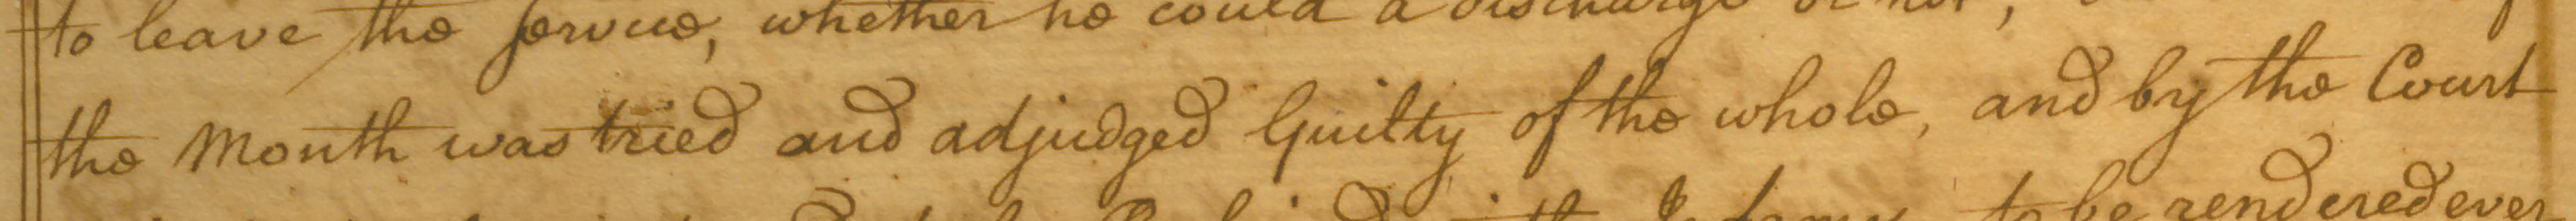the month was tried and adjudged Guilty of the whole, and by the Court
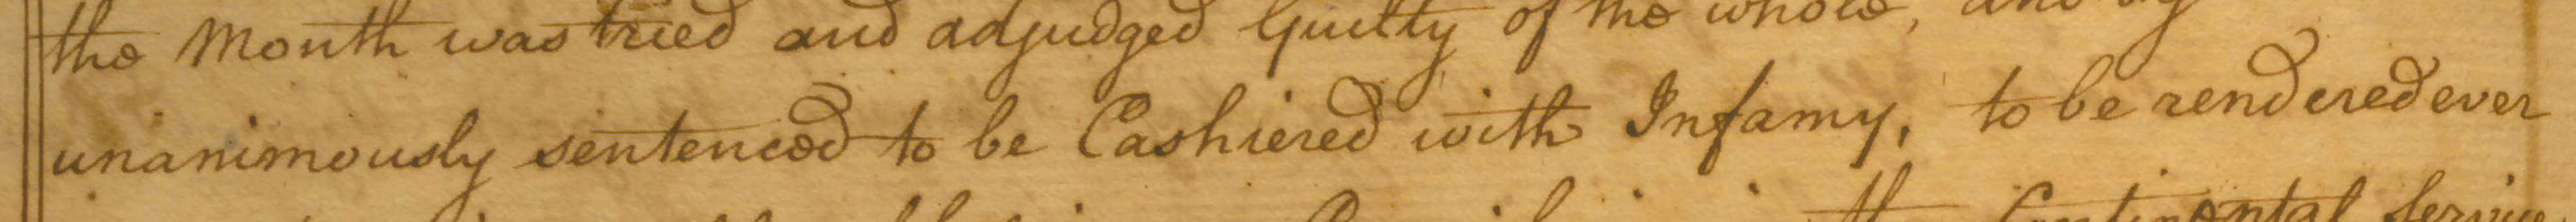unanimously sentenced to be Cashiered with Infamy, to be rendered ever
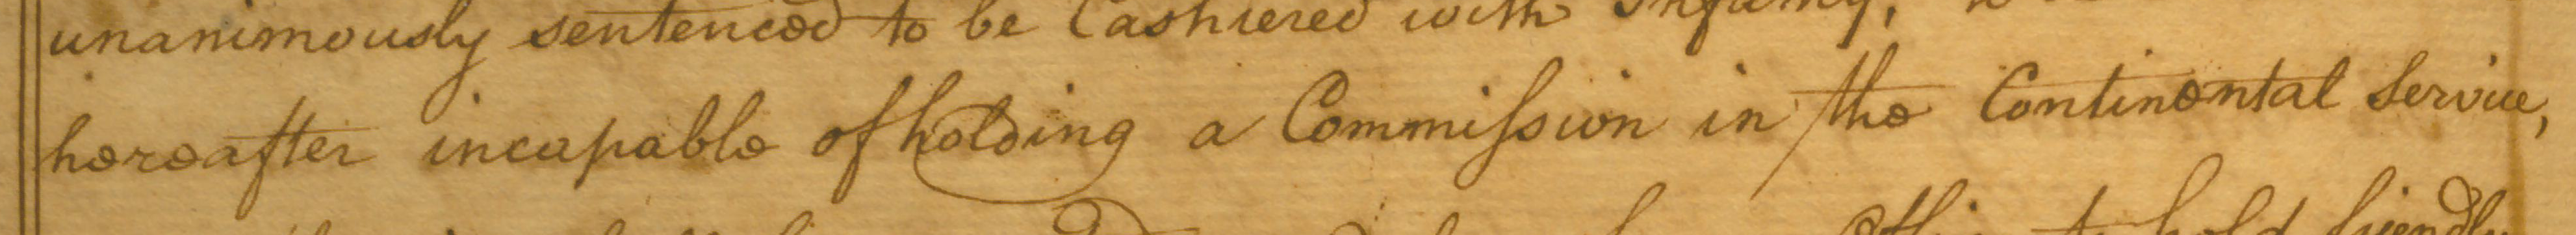hereafter incapable of holding a Commission in the Continental Service,
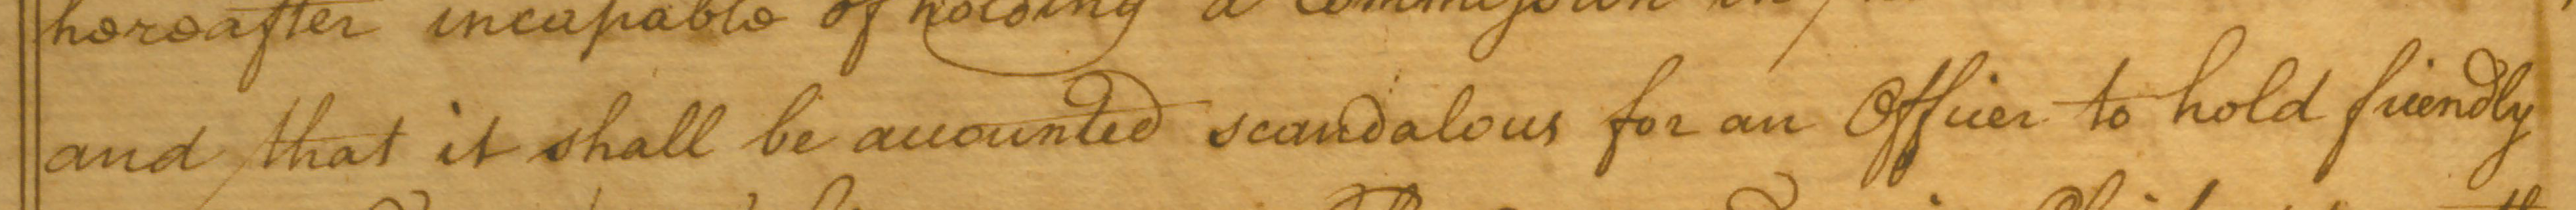and that it shall be accounted scandalous for an Officer to hold friendly
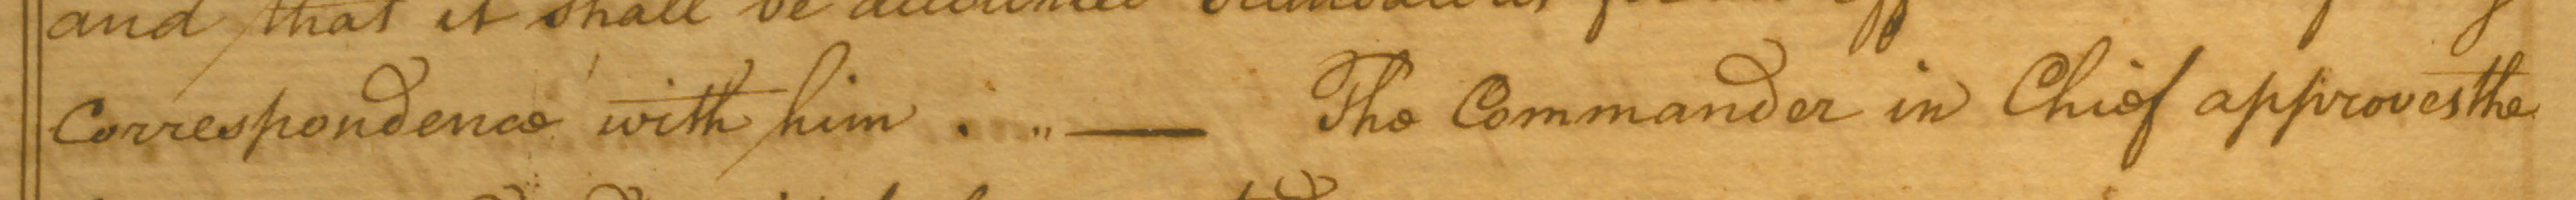Correspondence with him.- The Commander in Chief approves the
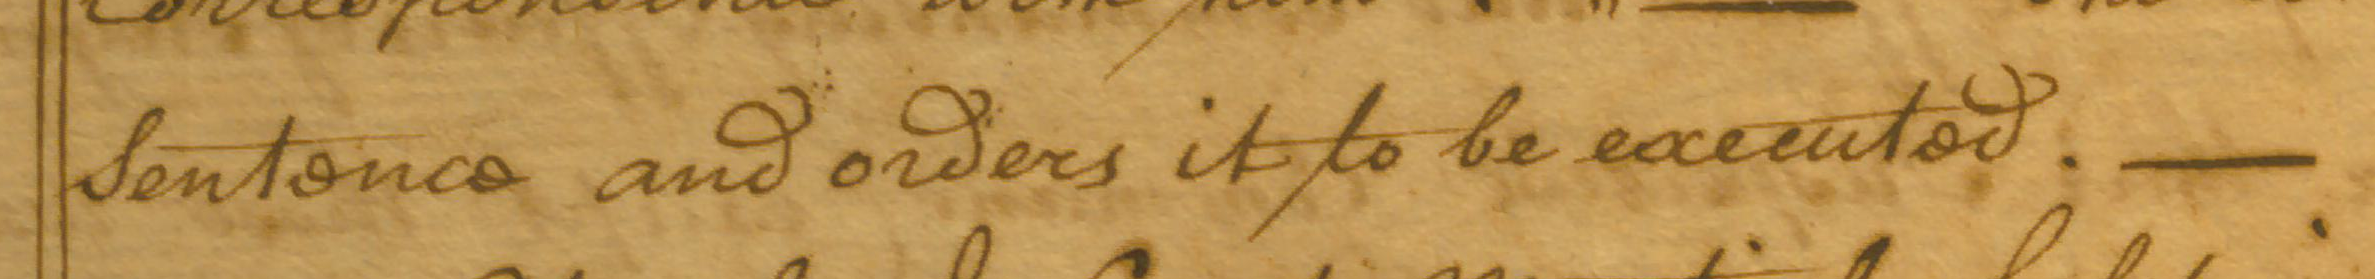Sentence and orders it to be executed.-
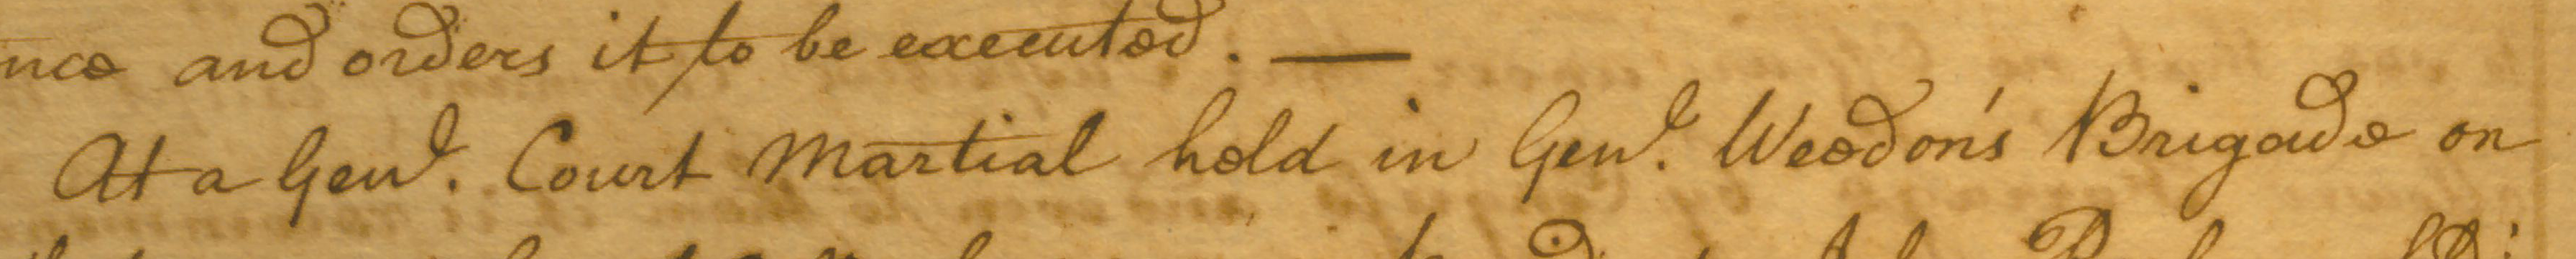At a Gen^l. Court Martial held in Gen^l. Weedon's Brigade on
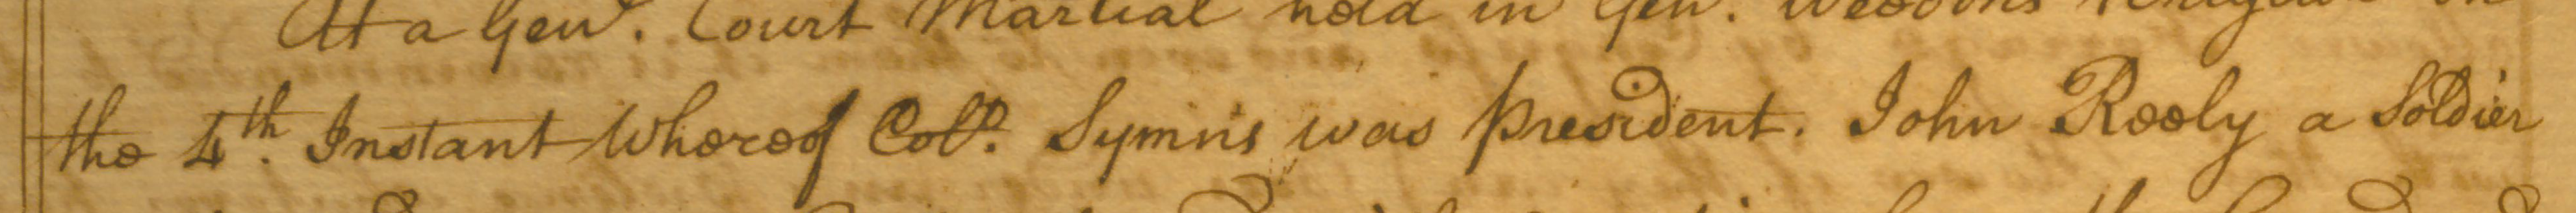the 4^th. Instant whereof Col^o. Symns was president. John Reely, a Soldier
